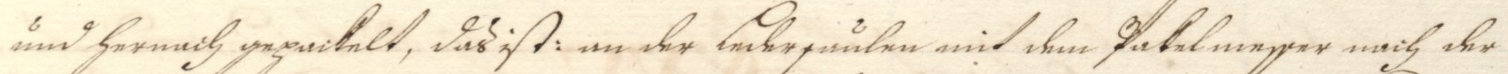und hernach gepackelt, das ist: an der Ledersaulen mit dem Pakelmesser nach der
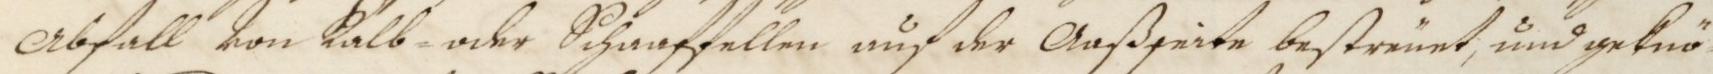Abfall von Kalb- oder Schaaffellen auf der Aaßseite bestreüet, und geknö-
